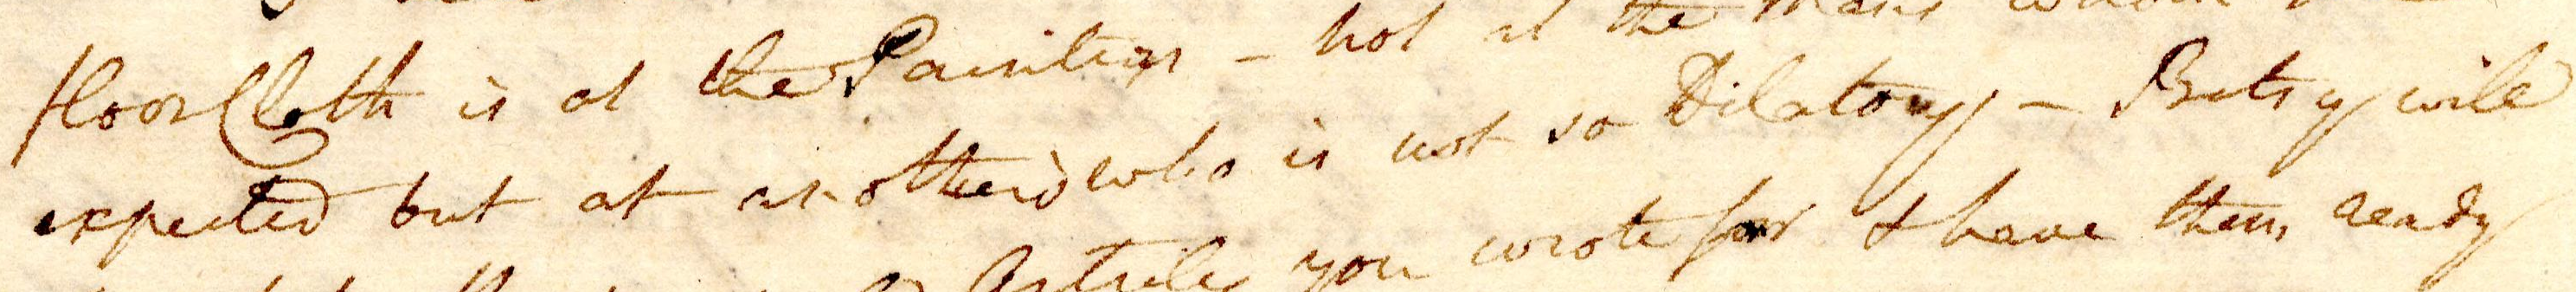expected but at another's who is just so Dilatoy. Betsy will
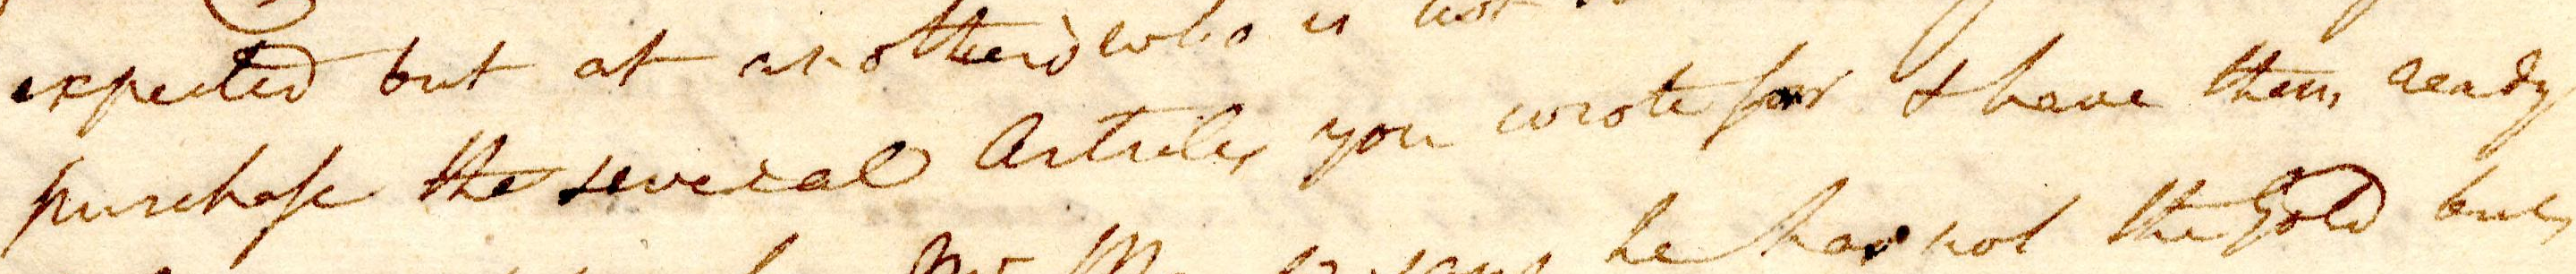purchase the several Articles you wrote for & have them, ready
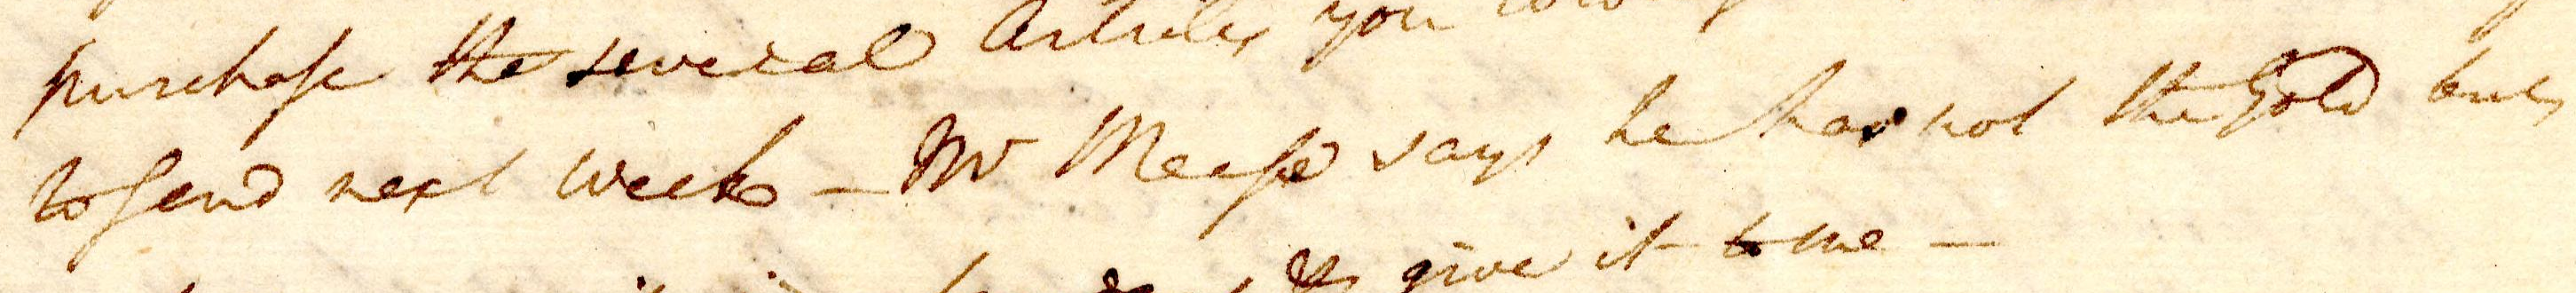to send next week. M^r Mease says he has not the Gold but
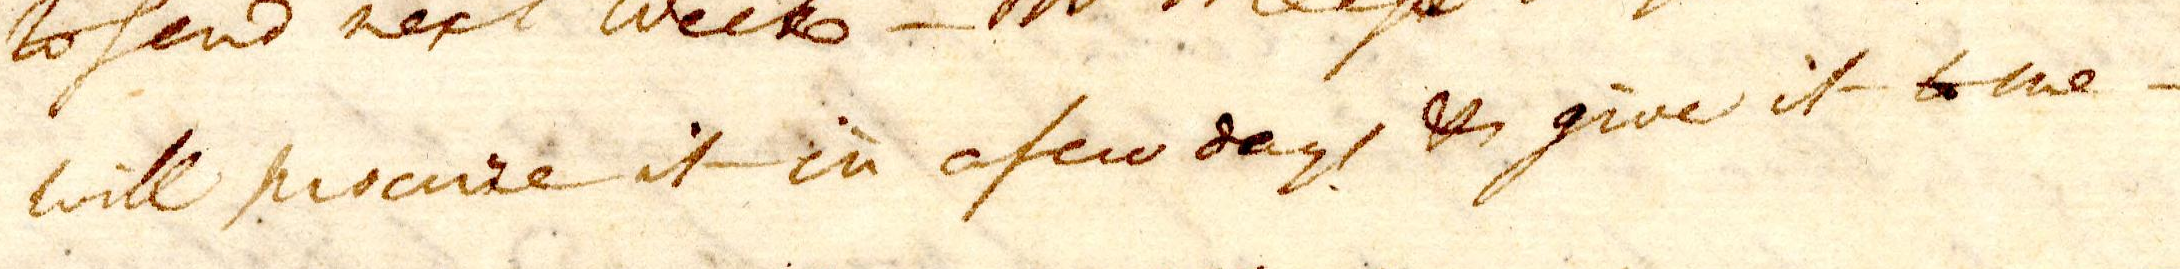will procure it in a few days & give it to me
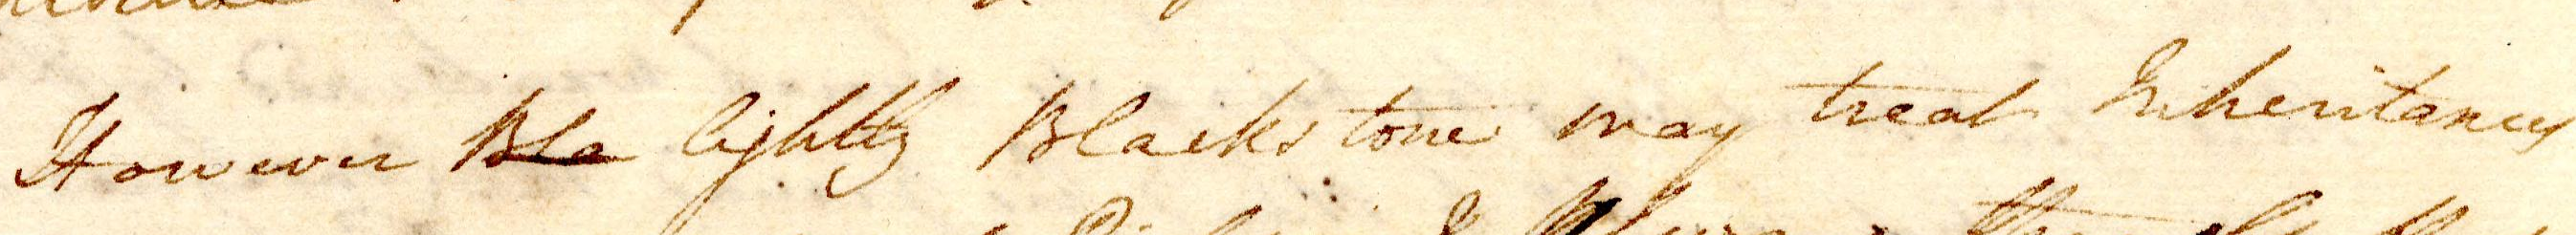However M^r lightly Blackstone may treat Inheritance
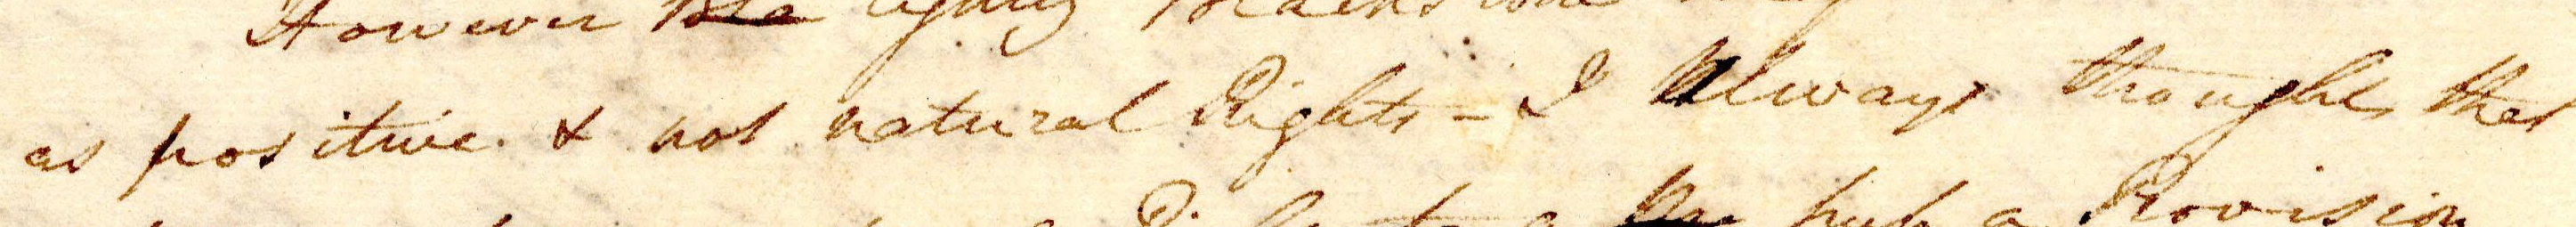as positive & not natural Rights- I Always thought that
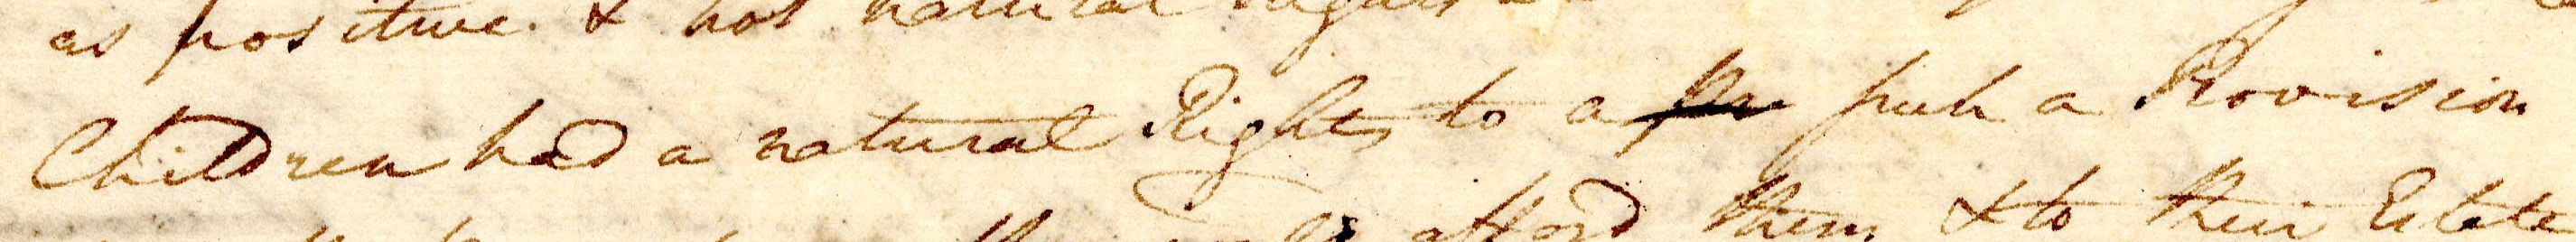Children had a natural Rights to a fre such a Provision
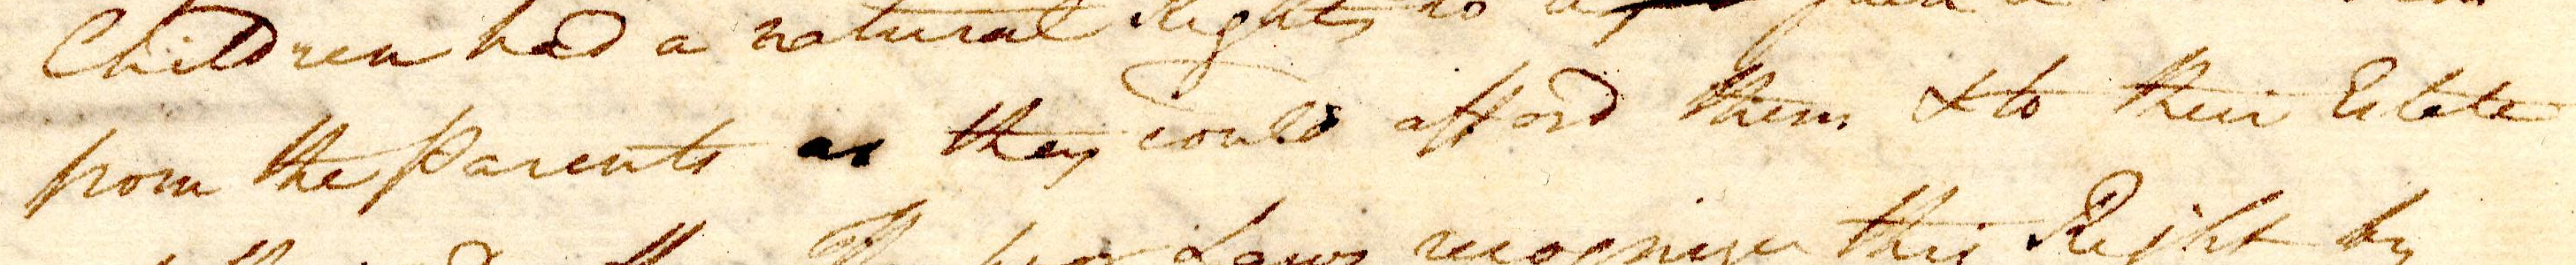from the parents as they could afford them & to their Estate
